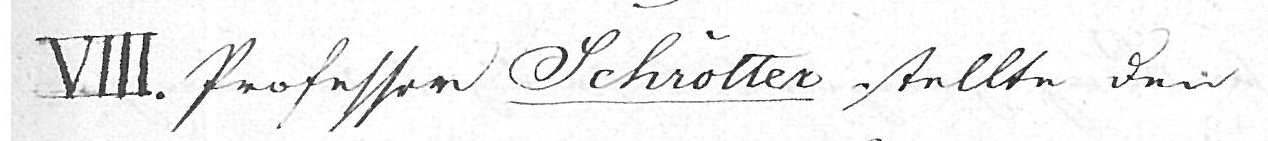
VIII. Professor Schrötter stellte den
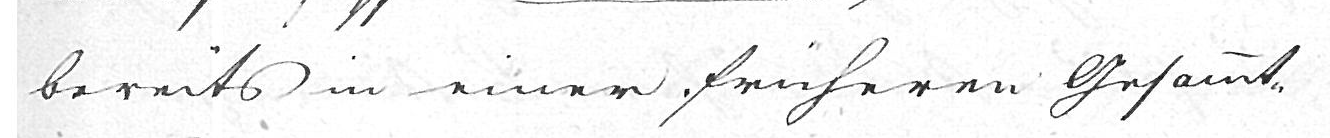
bereits in einer früheren Gesammt-
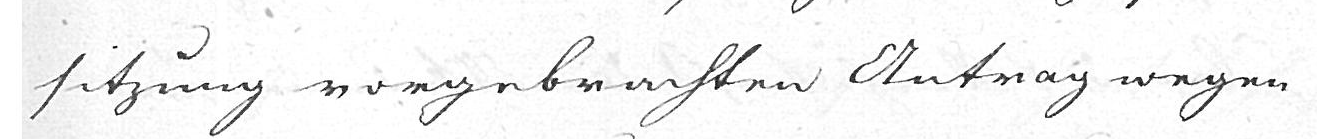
sitzung vorgebrachten Antrag wegen
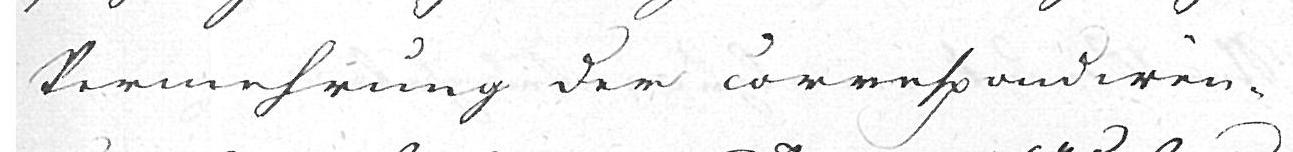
Vermehrung der correspondiren-
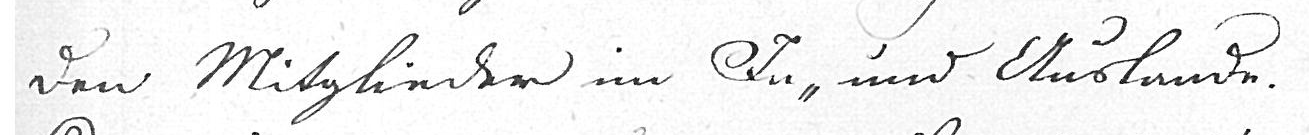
den Mitglieder im In- und Auslande.
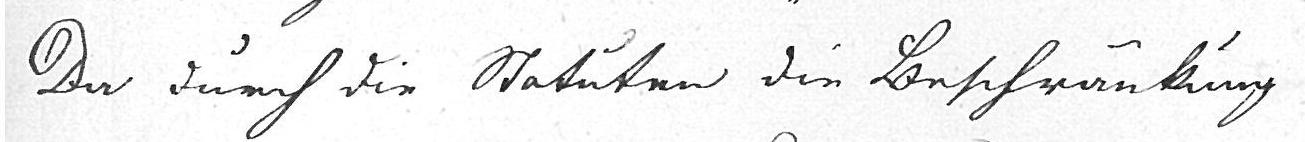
Da durch die Statuten die Beschränkung
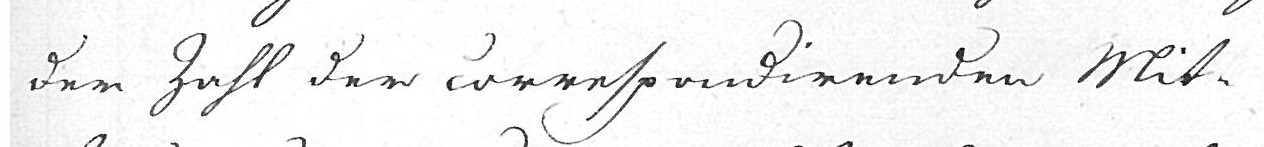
der Zahl der correspondirenden Mit-
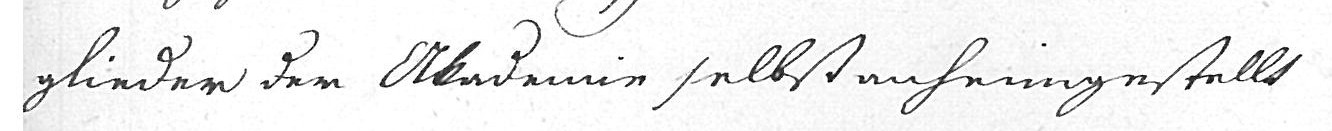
glieder der Akademie selbst anheimgestellt
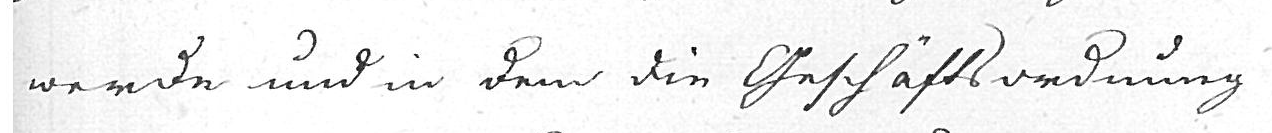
werde und in dem die Geschäftsordnung
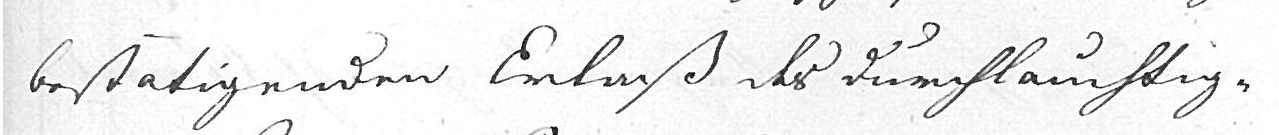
bestätigenden Erlaß des durchlauchtig-
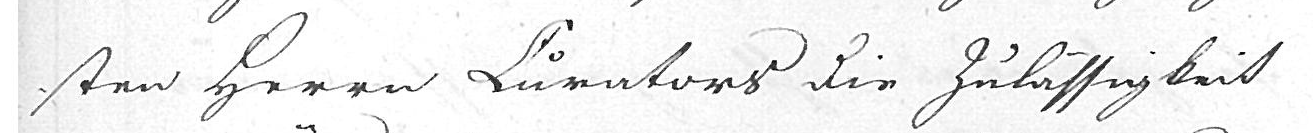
sten Herrn Curators die Zulässigkeit
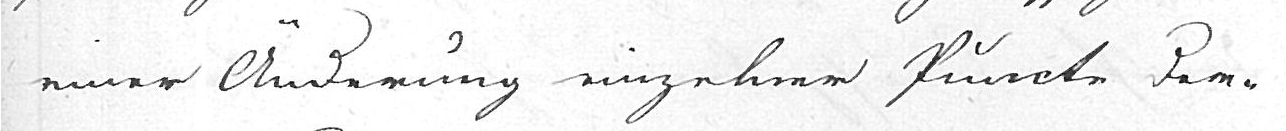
einer Änderung einzelner Puncte der-
